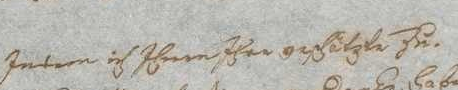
Indem ich Ihnen Ihre geschätzte Zu-
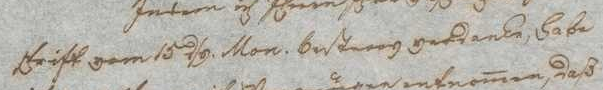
schrift vom 15 dss. Mon. bestens verdanke, habe
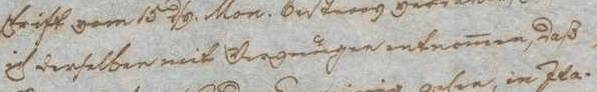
ich derselben mit Vergnügen entnommen, daß
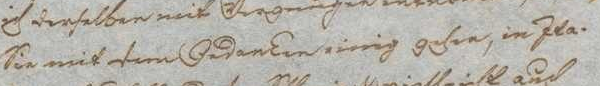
Sie mit dem Gedanken einig gehen, in Ita-
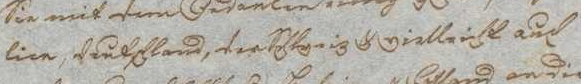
lien, Deutschland, der Schweiz & vielleicht auch
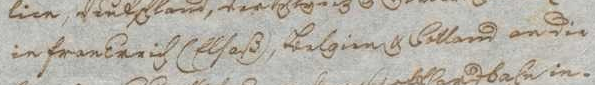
in Frankreich (Elsaß), Belgien & Holland an die
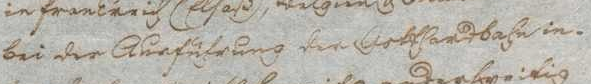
bei der Ausführung der Gotthardbahn in-
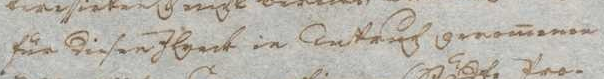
für diesen Zweck in Anspruch genommenen
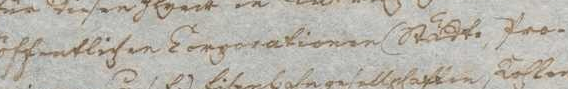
öffentlichen Corporationen (Städte, Pro-
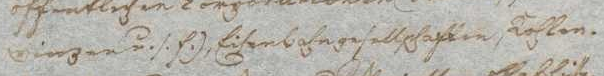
vinzen u. s. f.), Eisenbahngesellschaften, Kohlen-
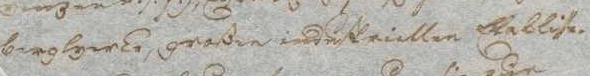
bergwerke, großen industriellen Etablisse-
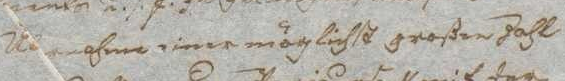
Übernahme einer möglichst großen Zahl
